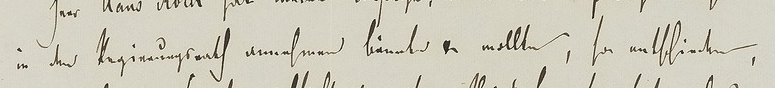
in den Regierungsrath annehmen könnte & wollte, so entschieden,
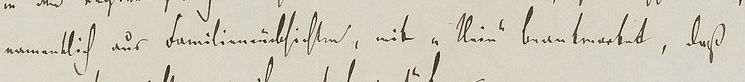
namentlich aus Familienrücksichten, mit «Nein» beantwortet, daß
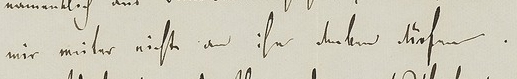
wir weiter nicht an ihn denken dürfen.
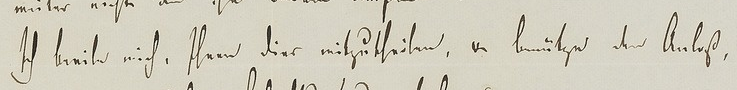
beeile mich, Ihnen dies mitzutheilen, & benütze den Anlaß,
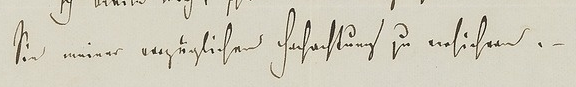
Sie meiner vorzüglichen Hochachtung zu versichern. –
